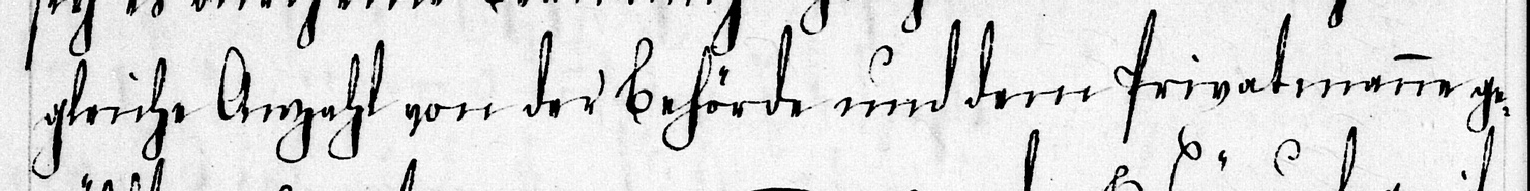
gleiche Anzahl von der Behörde und dem Privatmanne g¬
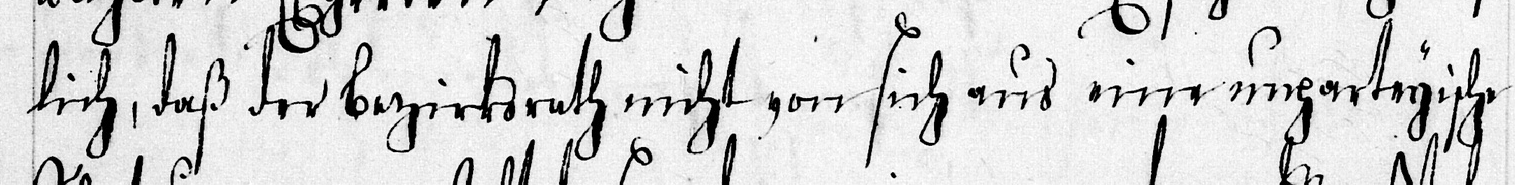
lich, daß der Bezirksrath nicht von sich aus eine unparteyische
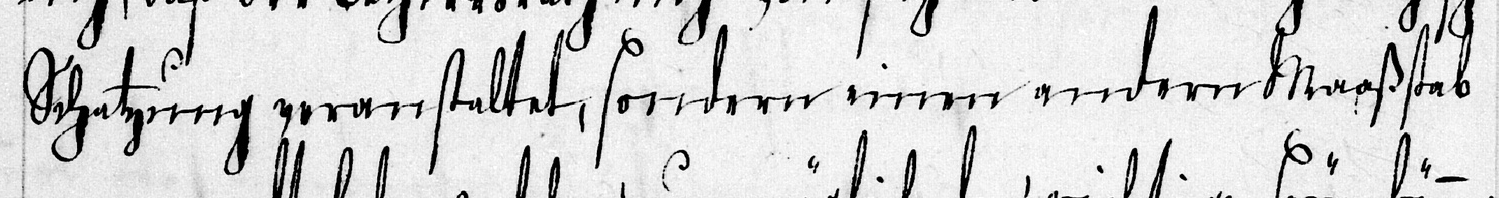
Schatzung veranstaltet, sondern einen andern Maaßstab
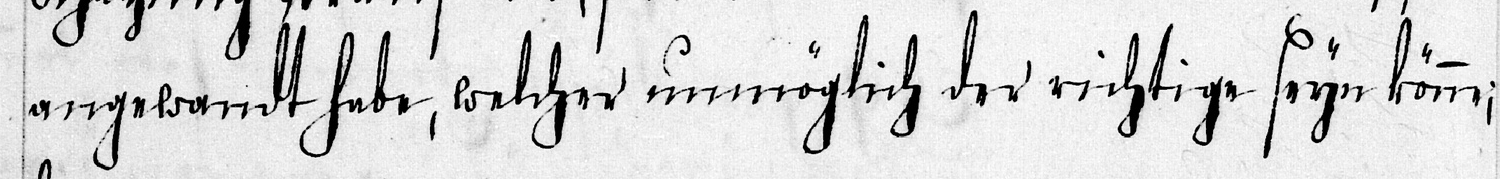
angewandt habe, welcher unmöglich der richtige seyn könn¬
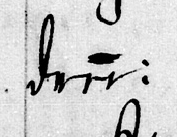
denn:
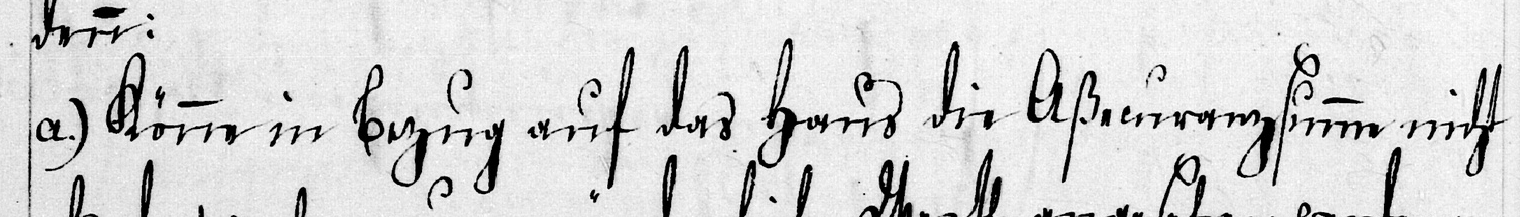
a.) Könne in Bezug auf das Haus die Aßecuranzsumme nicht
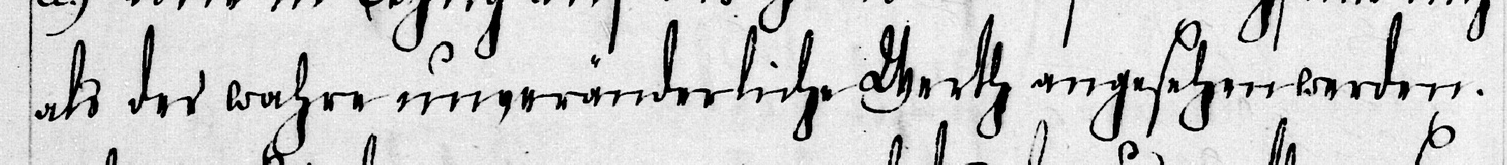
als der wahre unveränderliche Werth angesehen werden.
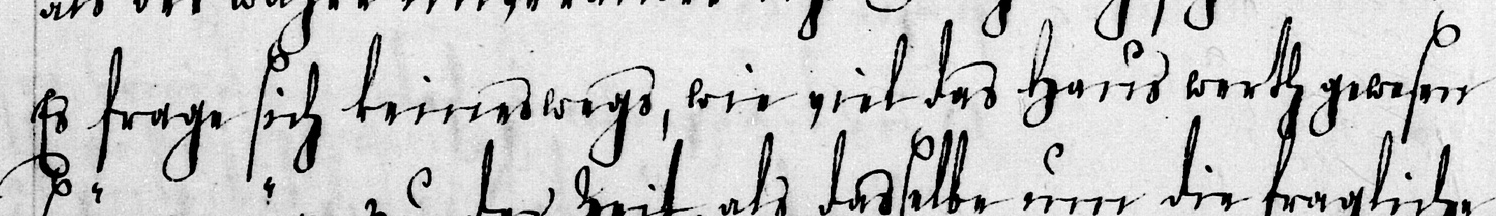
Es frage sich keineswegs, wie viel das Haus werth gewesen
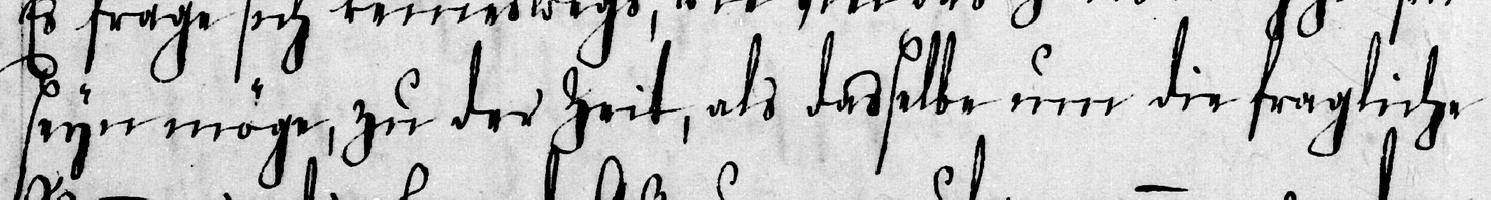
seyn möge, zu der Zeit, als dasselbe um die fragliche
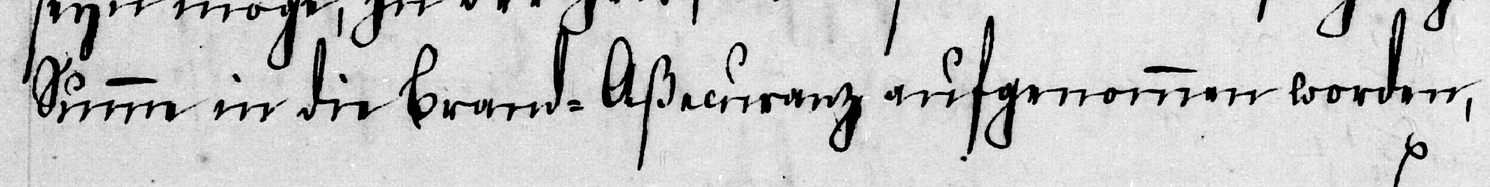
Summe in die Brand-Aßecuranz aufgenommen worden,
